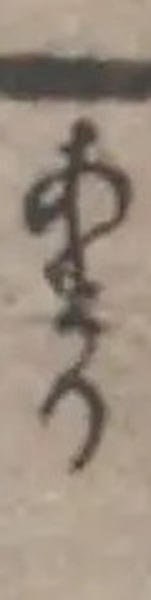あまり
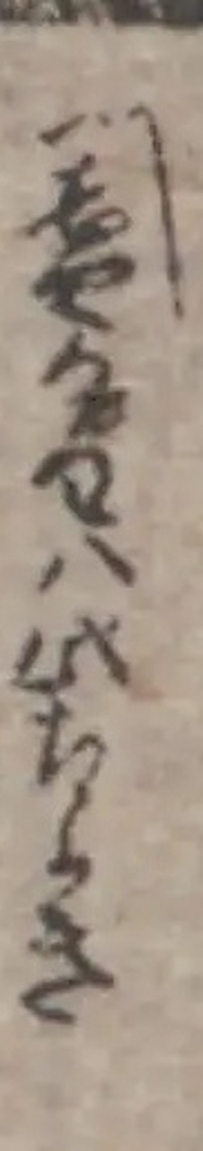〽しやか様は此ちよき
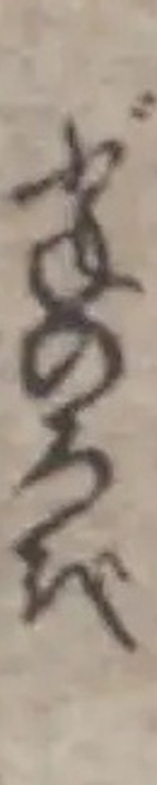ぶねのろを
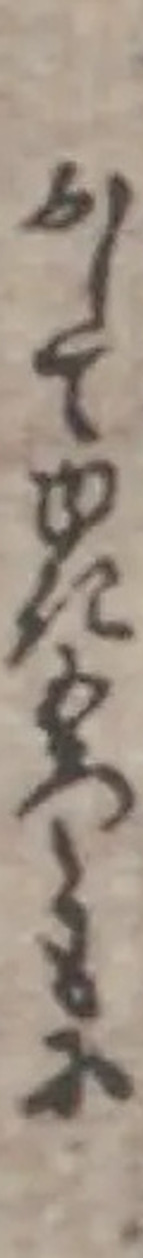おしてゆきもろともに
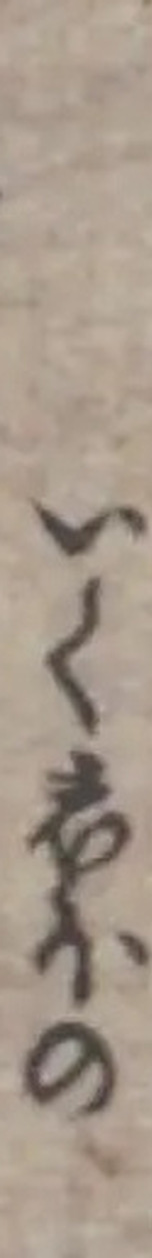いくしほの
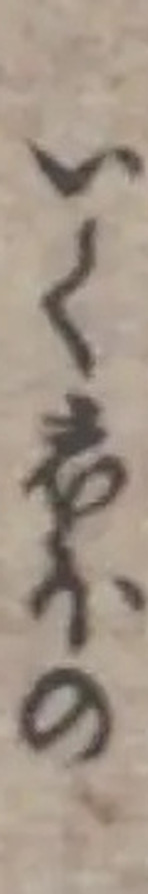いくしほの
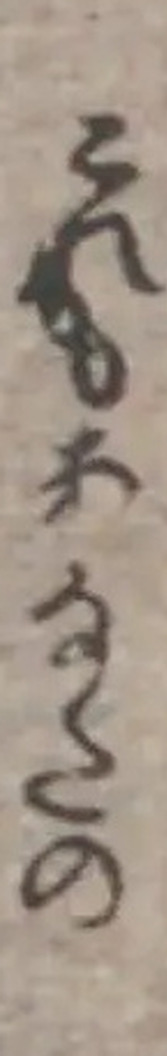これもあなたの
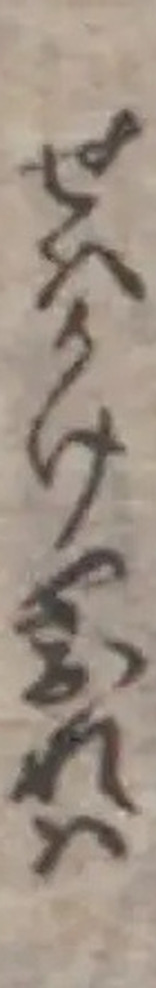せはかけやおれは
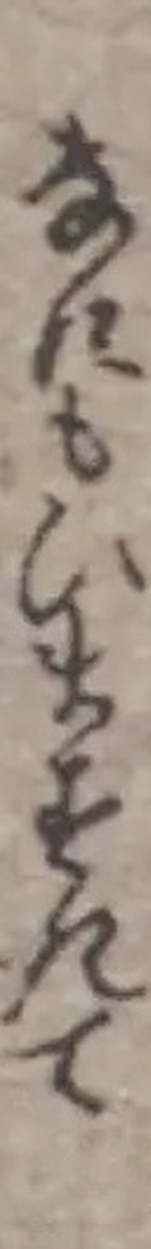なにもひますきて
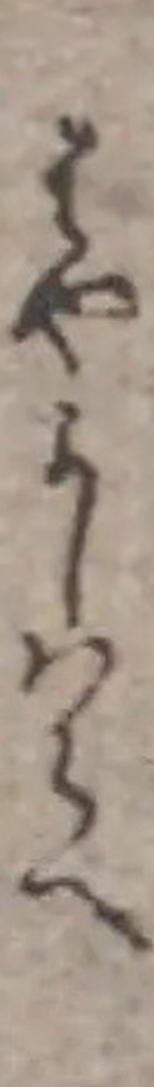はやよしわらへ
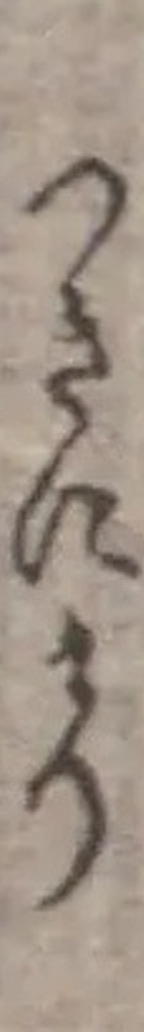つきにけり
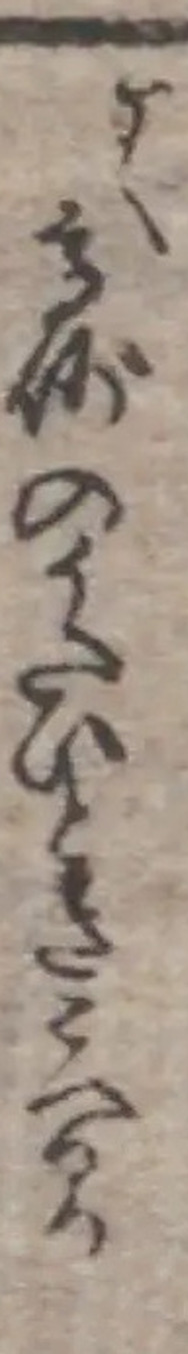アヽ高砂のうたひときこへるか
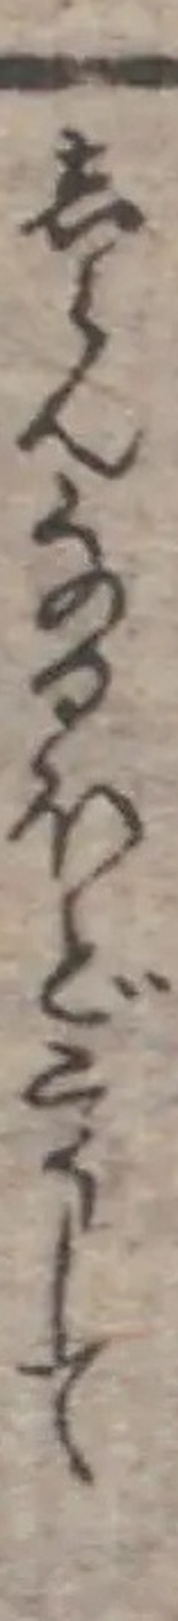しらんなるほどこうして
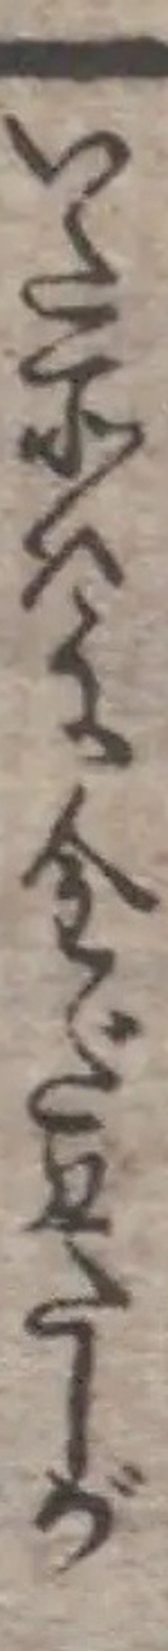いた所は千金だわたしが
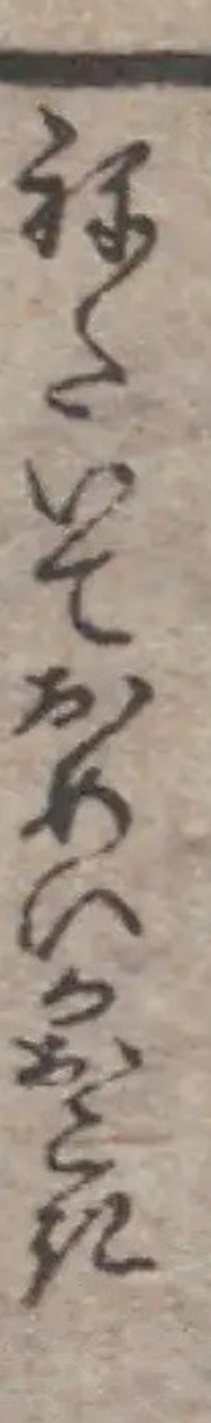ねたいておめいかおこき
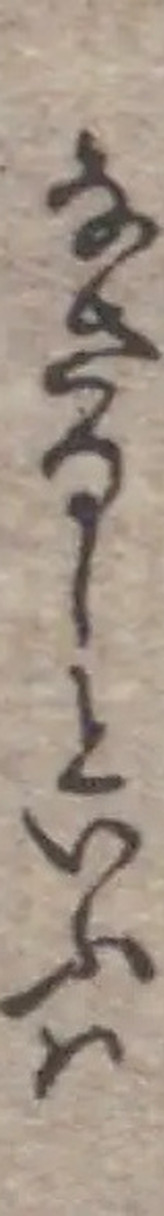なさるしといふは
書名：早出来 3巻
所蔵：国立国会図書館 National Diet Library, JAPAN
